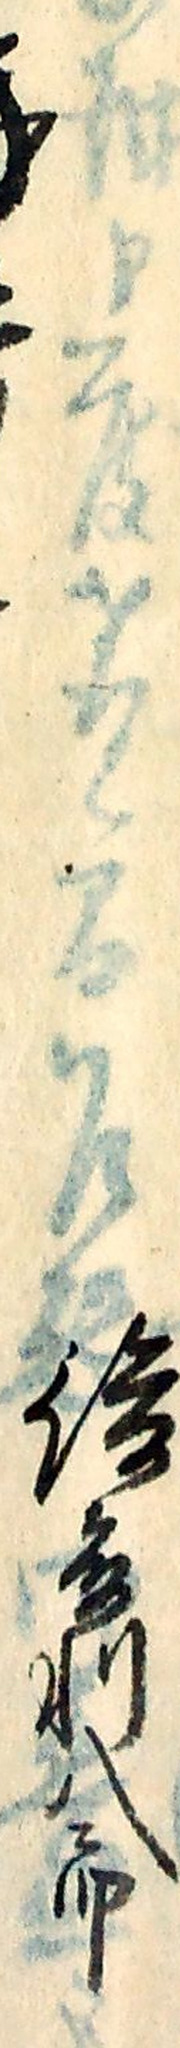後藤利八郎
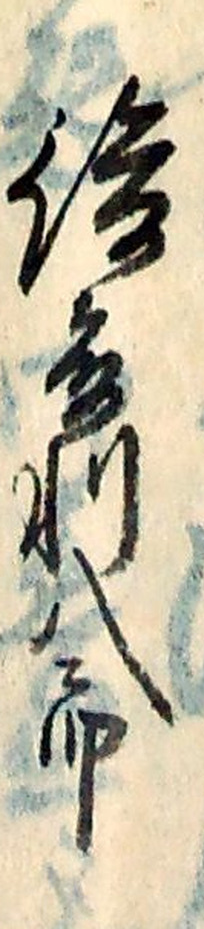後藤利八郎
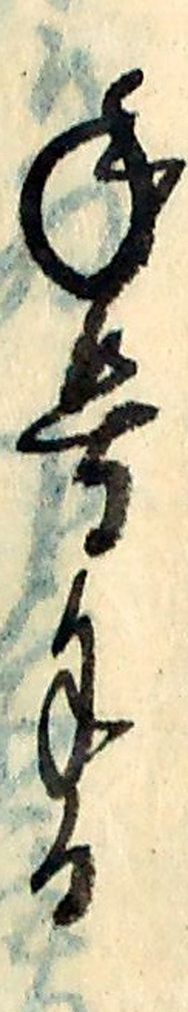年号月日
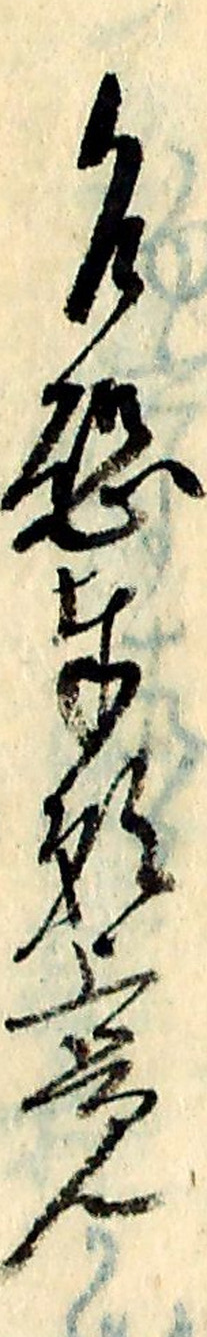乍恐奉願上覚
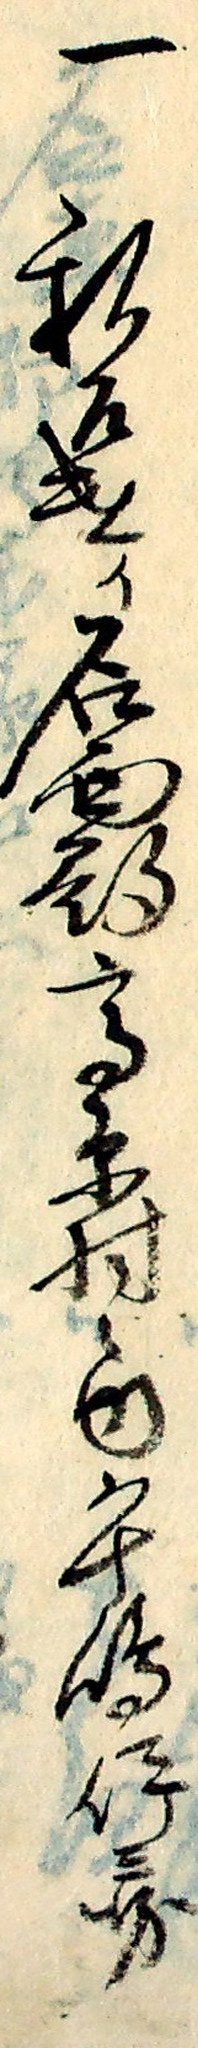一私共遣い名西郡高原村之内平島伊兵衛
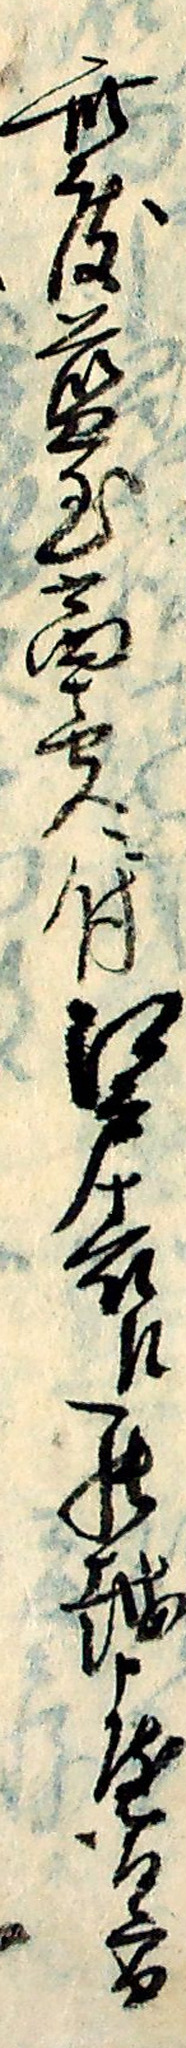此度藍玉商売に付江戸表え罷越申度奉存候間
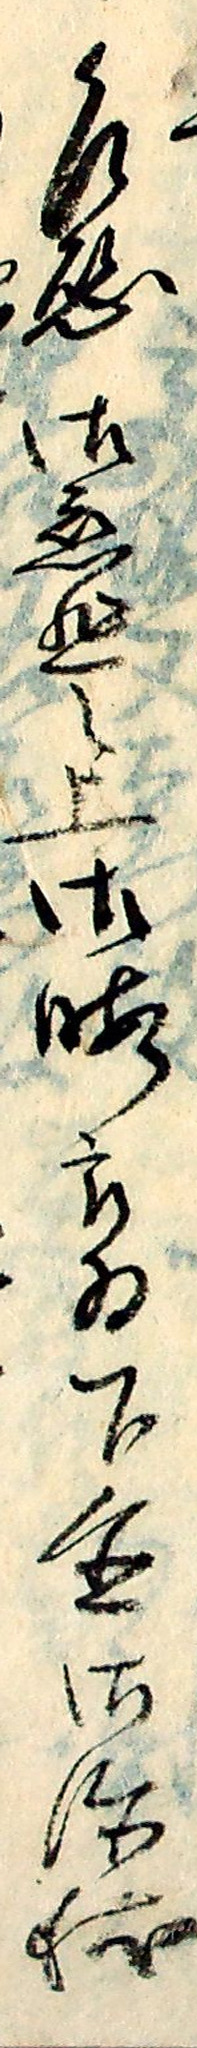乍恐御慈悲之上御暇被為下置御添状
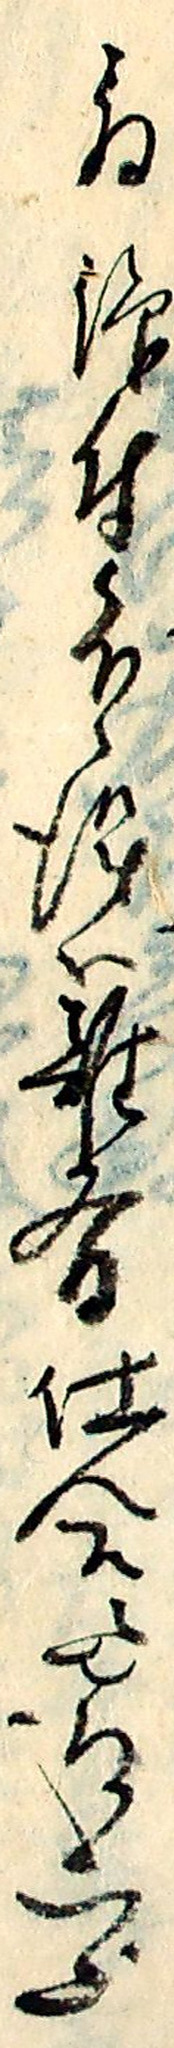被為仰付被下候得は難有仕合に奉存候以上
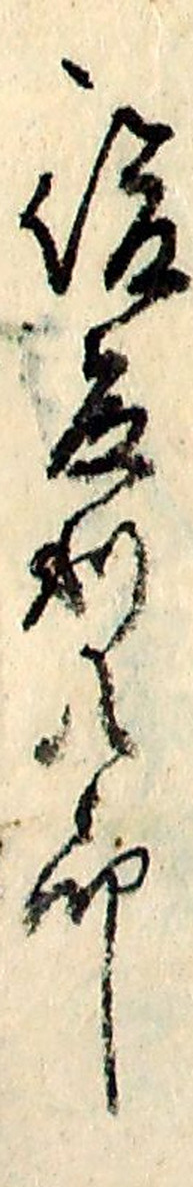後藤利八郎

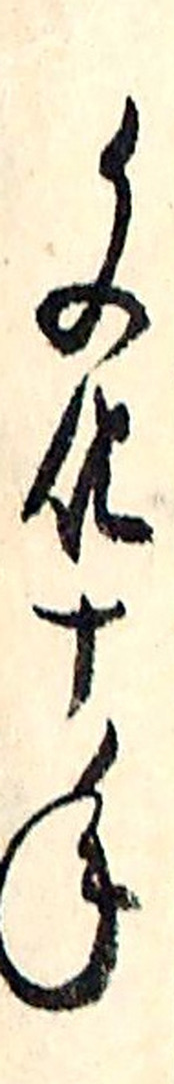文化十年
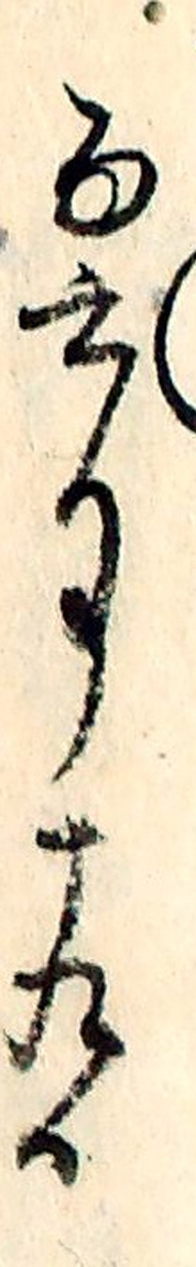酉六月十九日
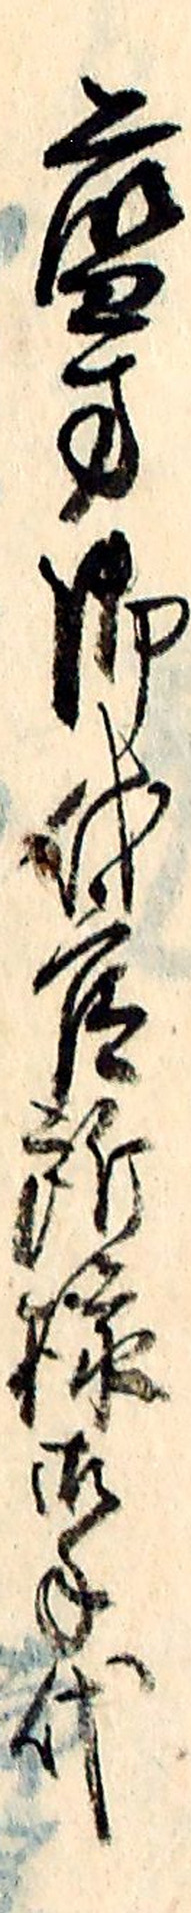藍方御代官所様御手代
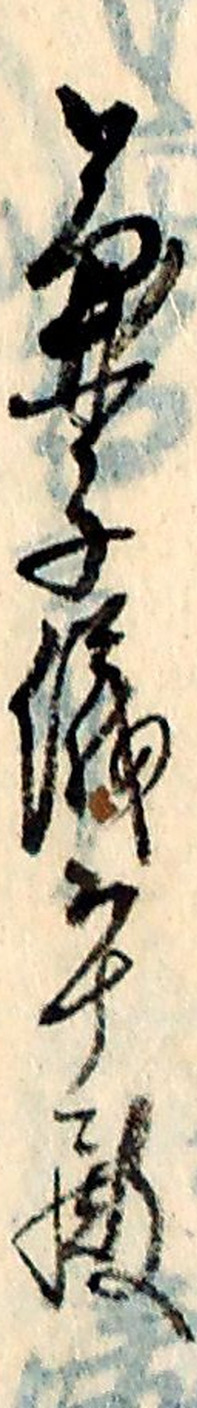兼子儀平殿
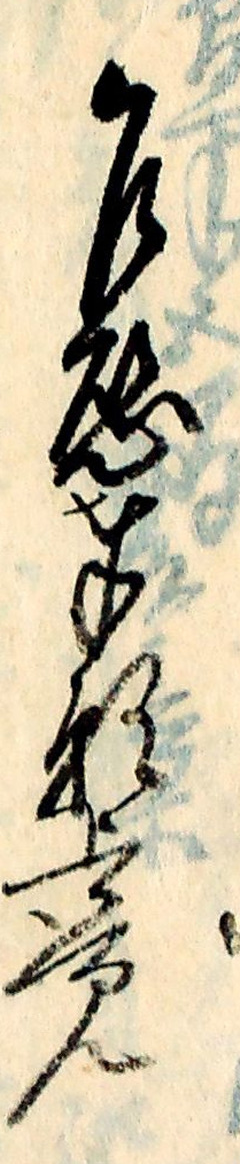乍恐奉願上覚
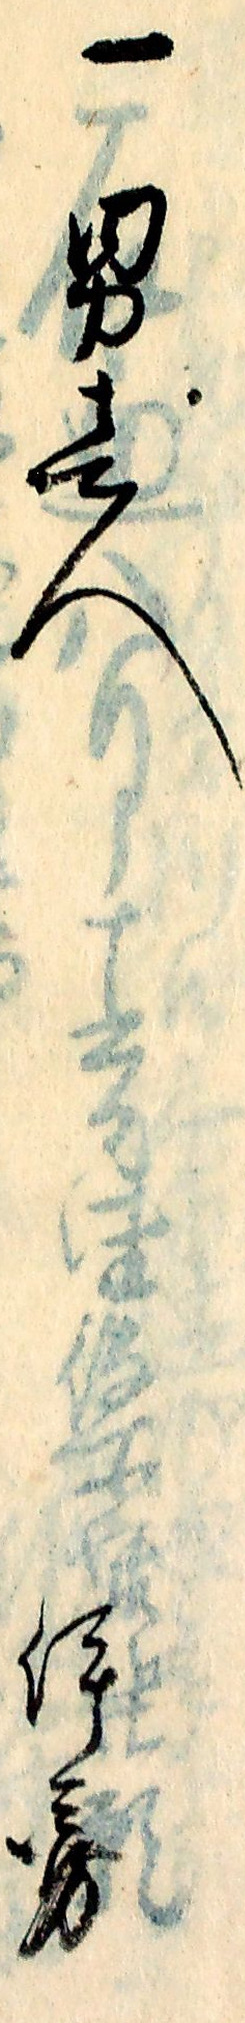一男壱人伊兵衛
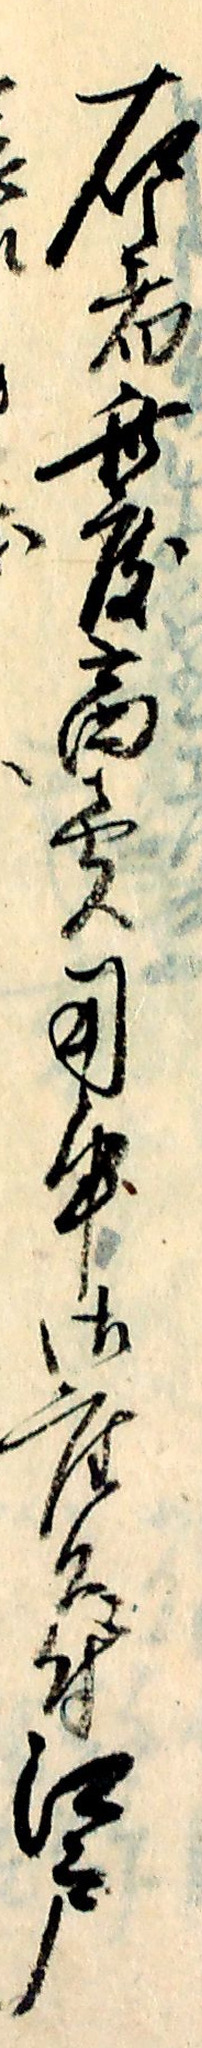右之者此度商売用事御座候に付江戸
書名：諸御願書控(後藤氏壱番）
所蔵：鳴門教育大学 Naruto University of Education
